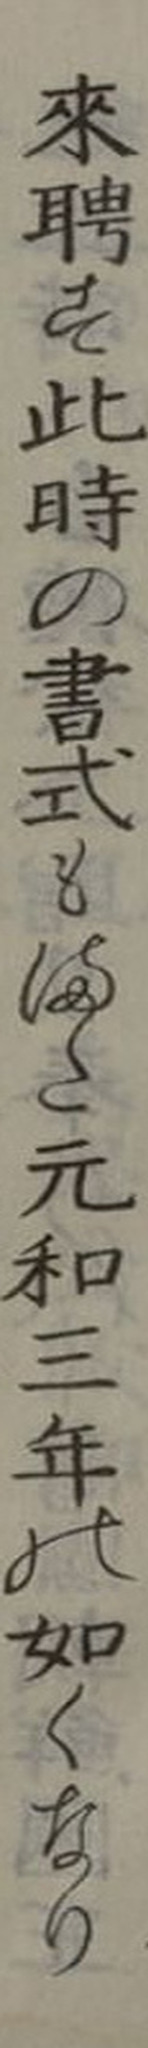來聘す此時の書式もまた元和三年の如くなり
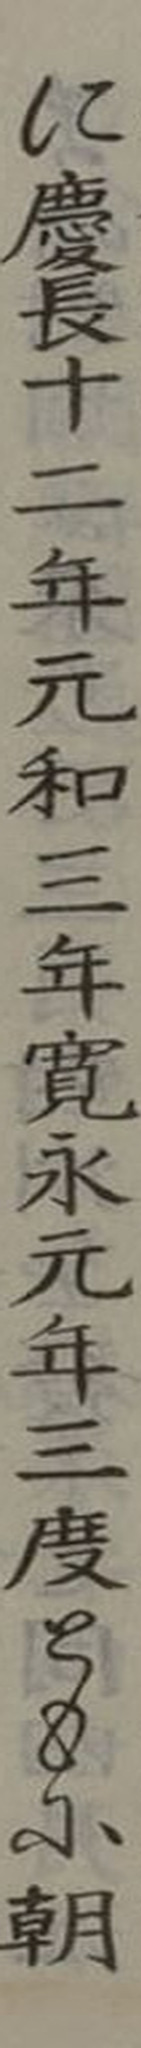に慶長十二年元和三年寛永元年三度ともに朝
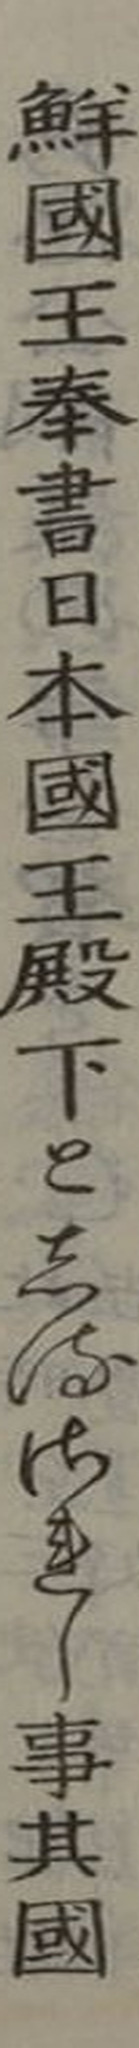鮮國王奉書日本國王殿下としるされし事其國
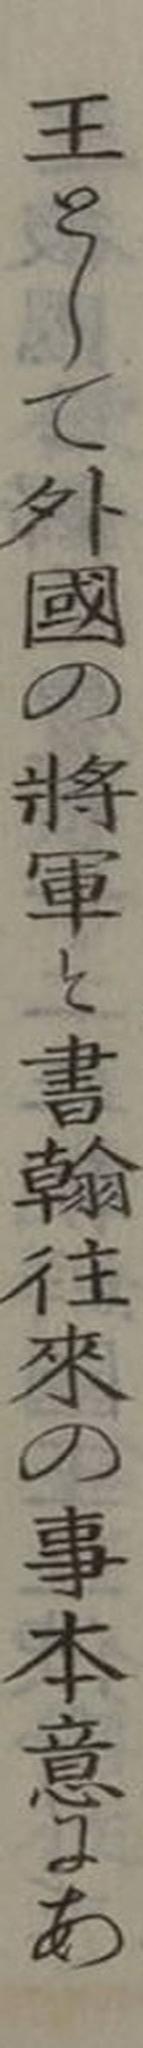王として外國の將軍と書翰往來の事本意にあ
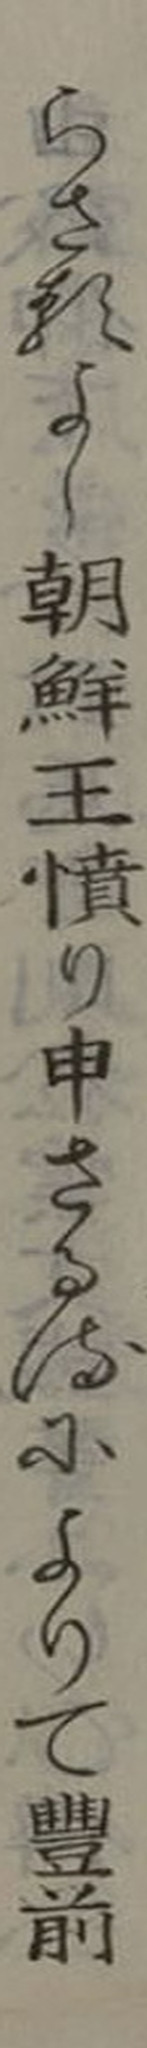らさるよし朝鮮王憤り申さるるによりて豐前
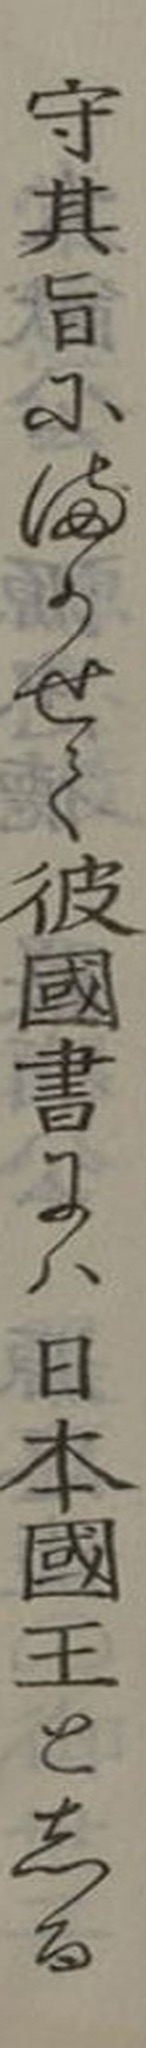守其旨にまかせて彼國書にハ日本國王としる
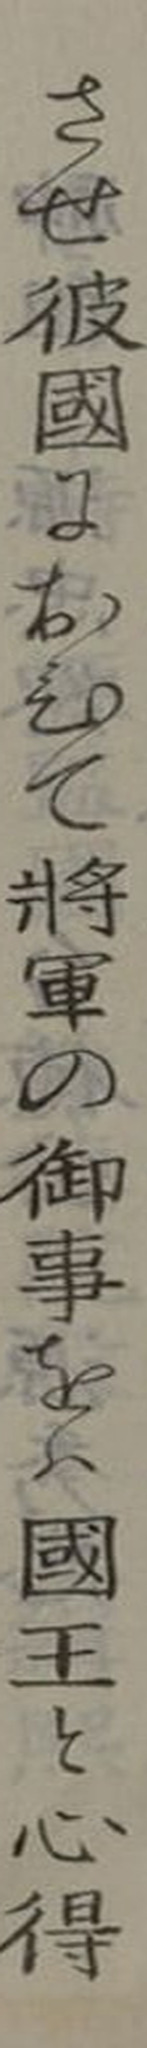させ彼國におひて將軍の御事をハ國王と心得
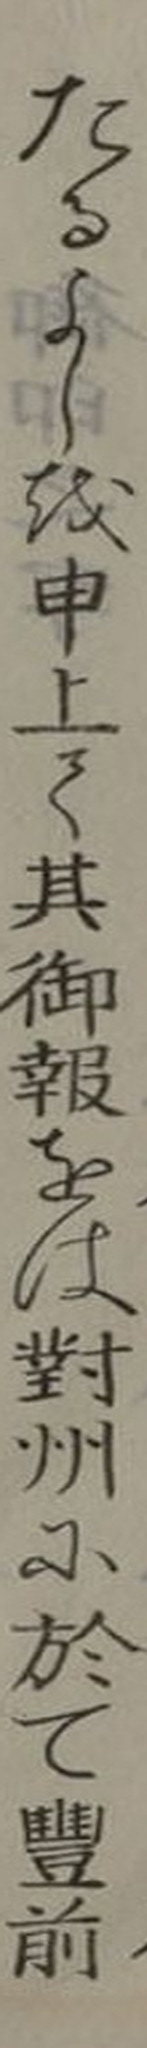たるよしを申上て其御報をは對州に於て豐前
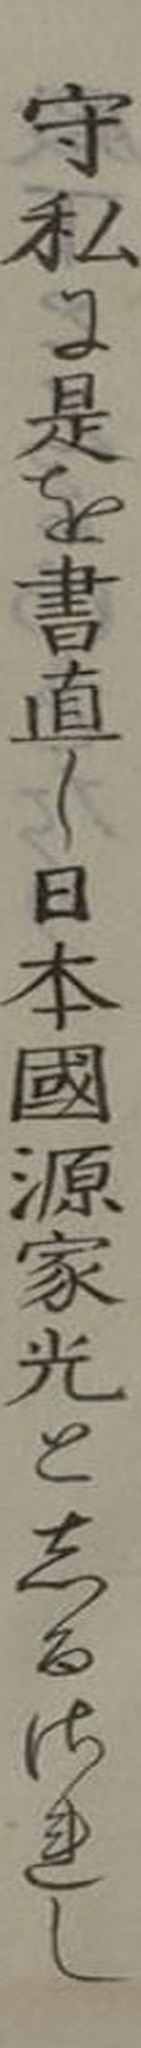守私に是を書直し日本國源家光としるされし
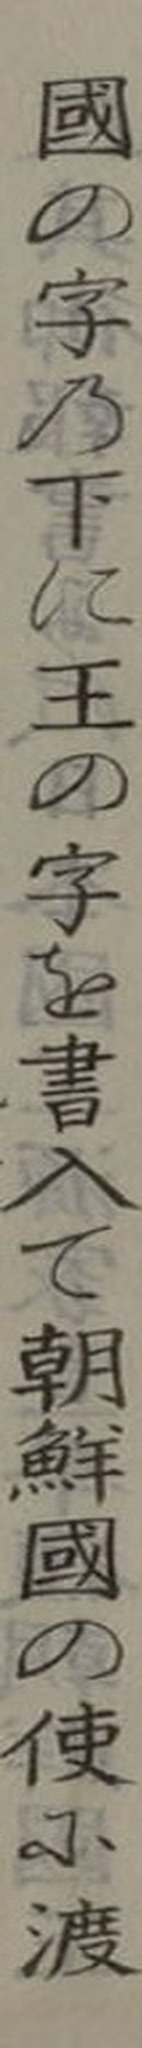國の字の下に王の字を書入て朝鮮國の使に渡
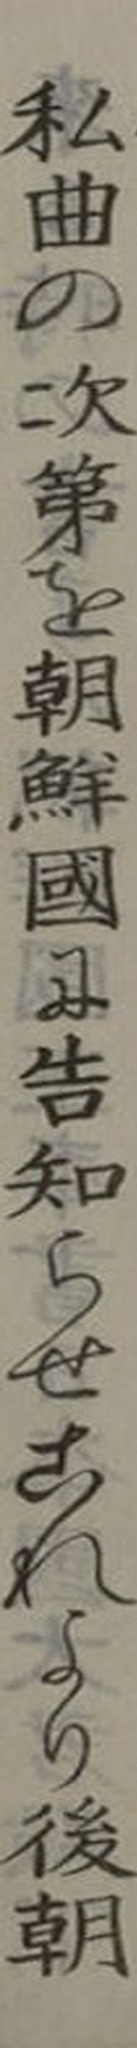私曲の次第を朝鮮國に告知らせこれより後朝
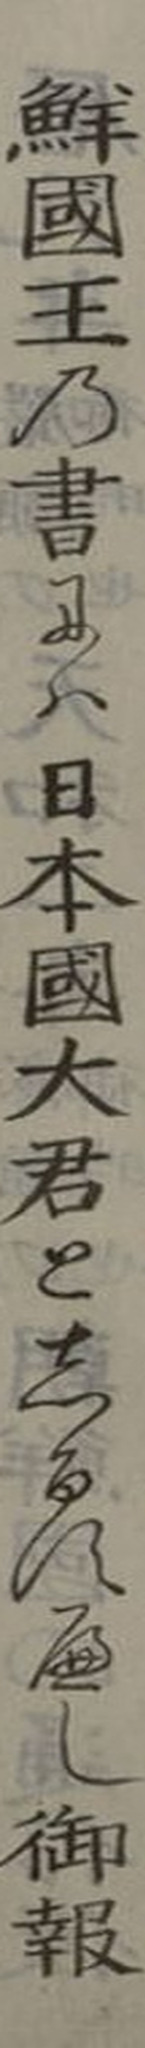鮮國王の書にハ日本國大君としるすへし御報
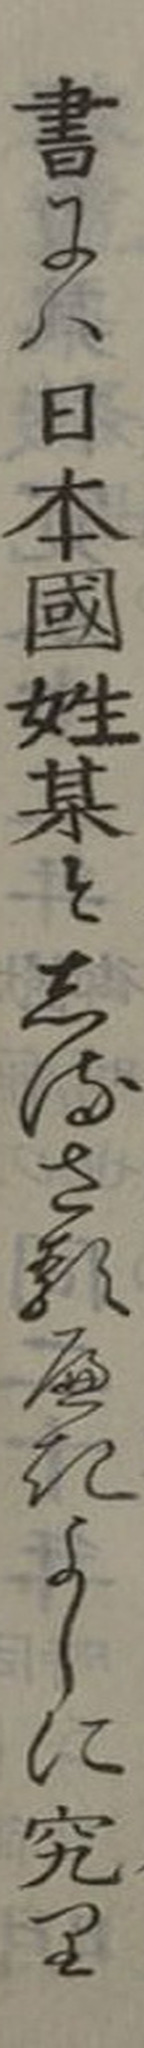書にハ日本國姓某としるさるへきよしに究り

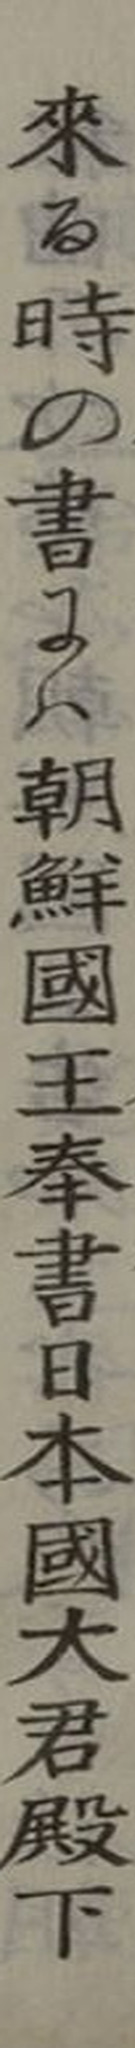來る時の書にハ朝鮮國王奉書日本國大君殿下
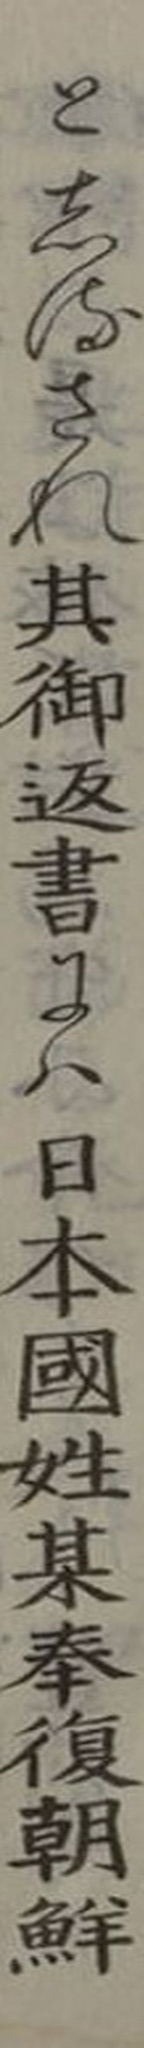としるされ其御返書にハ日本國姓某奉復朝鮮
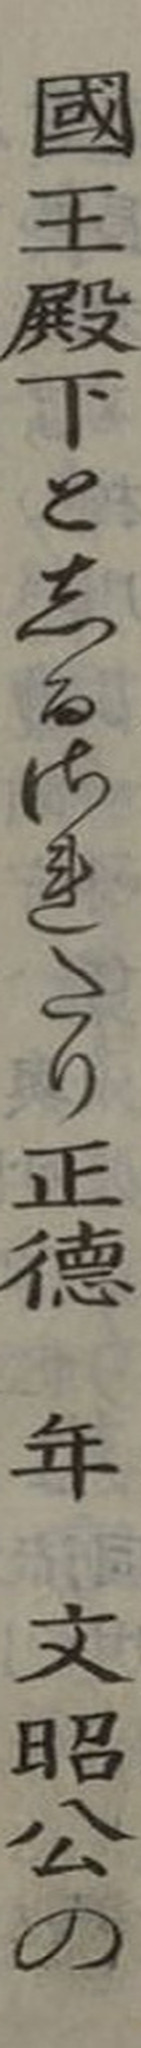國王殿下としるされたり正德年文昭公の
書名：骨董録
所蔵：University of the Ryukyus Library
